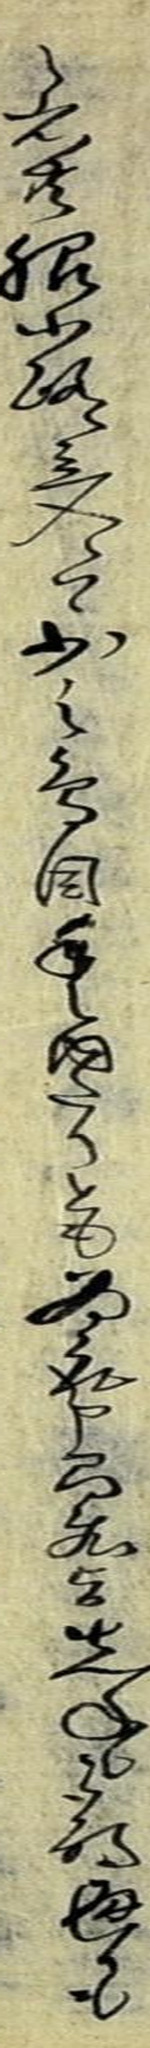之者共脇小路立入候ハヽ少之鳥目手之内たりとも為取申間敷旨先年も御触通りも
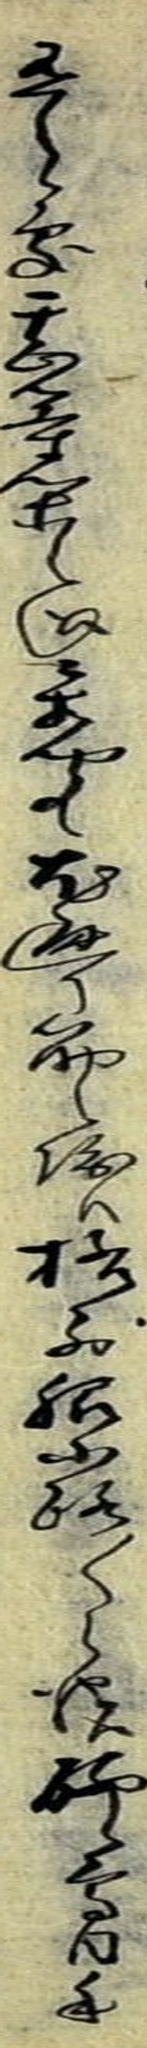有之候処甚等閑之趣ニ相聞候尤通り筋之儀ハ格別脇小路〳〵之儀ハ聊之鳥目手
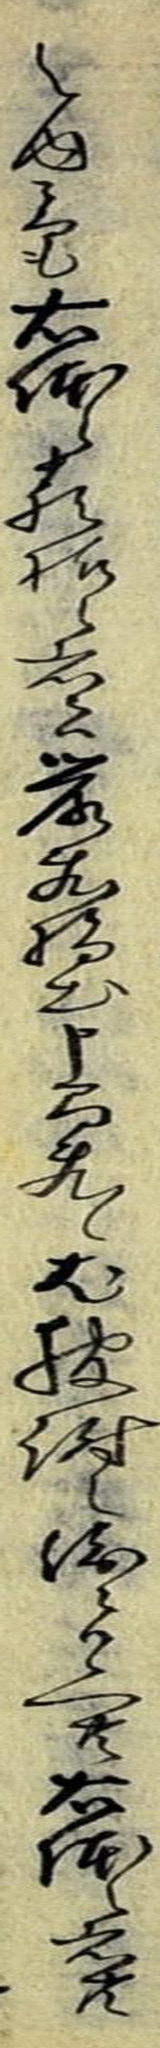之内ニ而も右体之類様之者ニハ厳敷指出申間敷候尤報謝之儀ニハ候へ共右体之者共
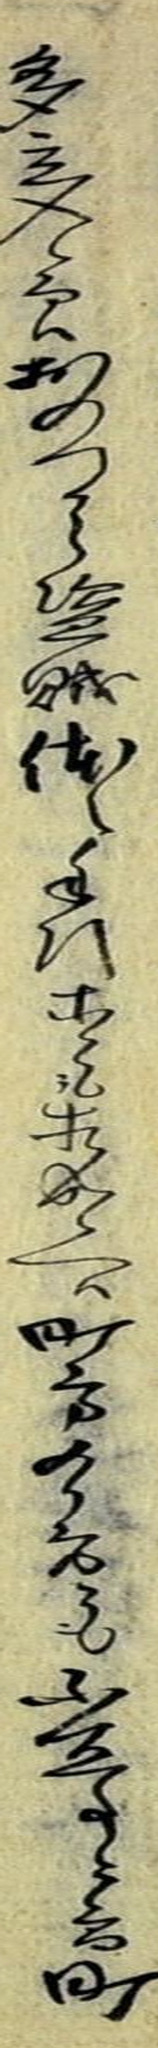多立入候而ハおのつから盗賊体之手引等とも相成候ヘハ町方〆り方ニも不宜事ニ候間町
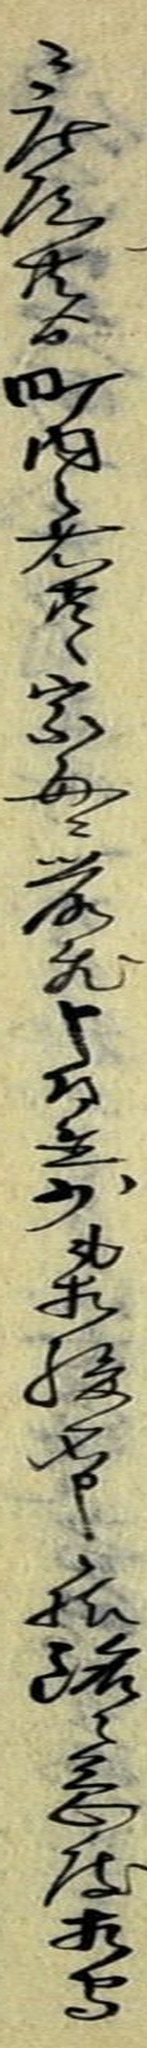々庄屋共ゟ町内之者共へ家毎ニ厳敷申付置少も相緩不申候様銘々急度相守
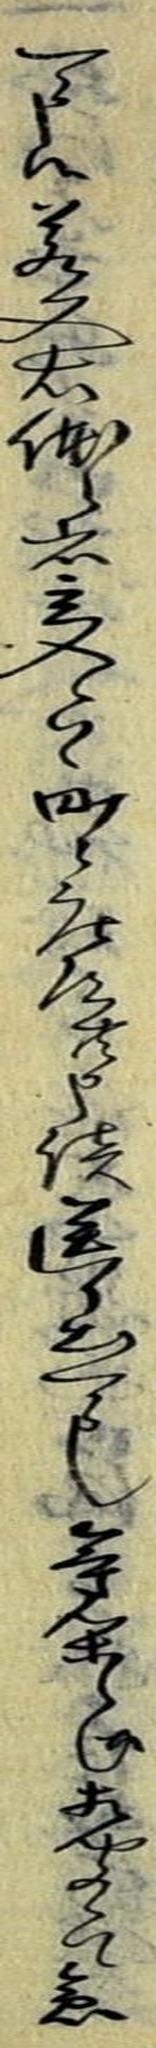可申候若又右体之者立入候ハヽ町々庄屋共申談送り出可申候等閑之趣相聞候ハヽ急
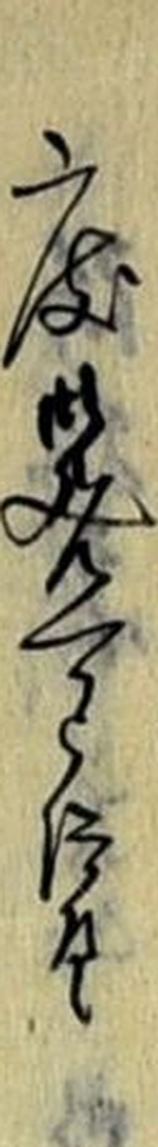度御咎可被仰付候
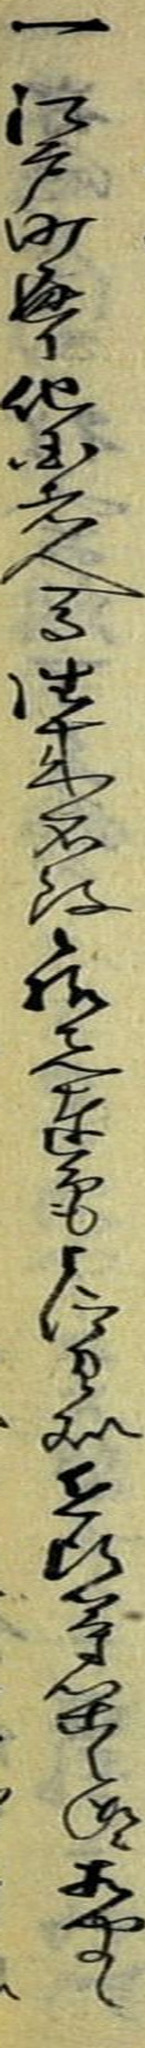一江戸町通り他国者人馬往来不致候様先達而も被仰付候処近頃等閑之趣ニ相聞候
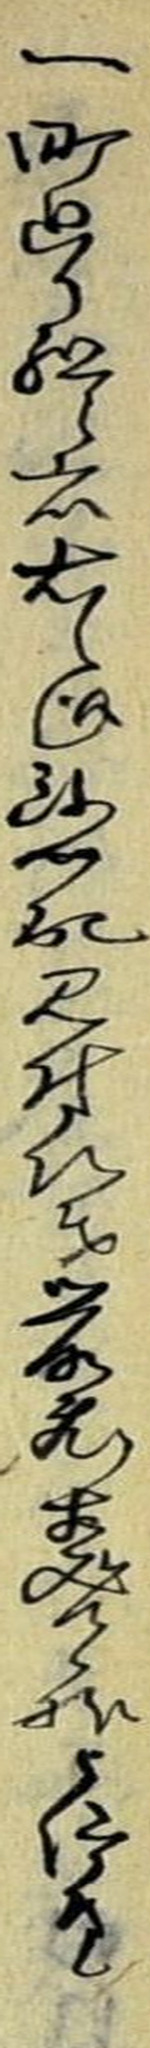一町廻り組之者右之趣致心配見付次第厳敷相咎候様被仰付候
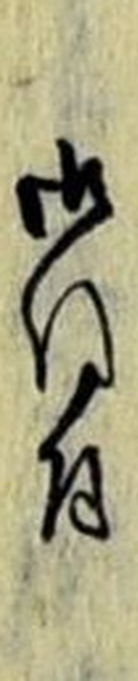御目付
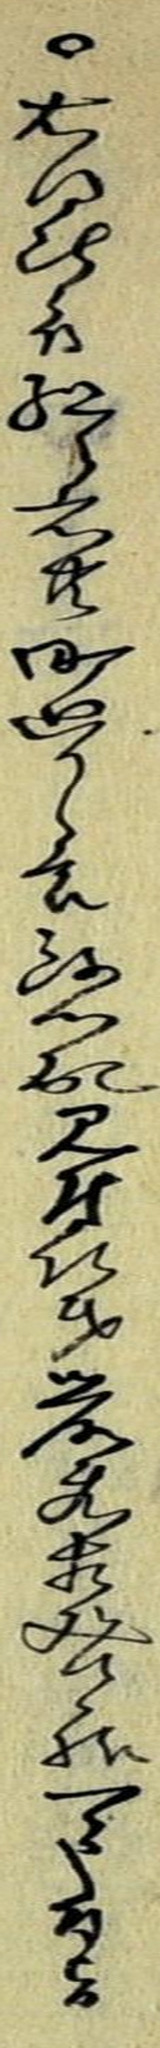〇右同断ニ付組之者共町廻り之節致心配見付次第厳敷相咎候様可申付旨
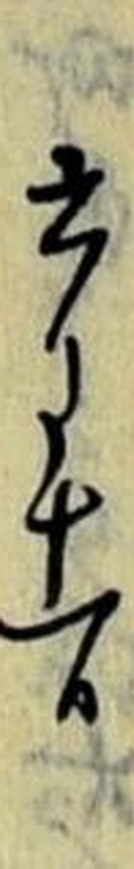六月十一日
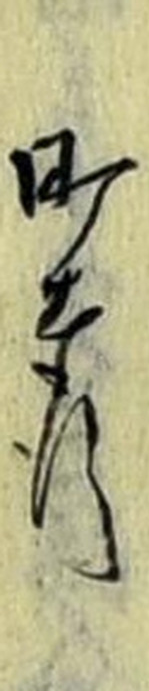町奉行
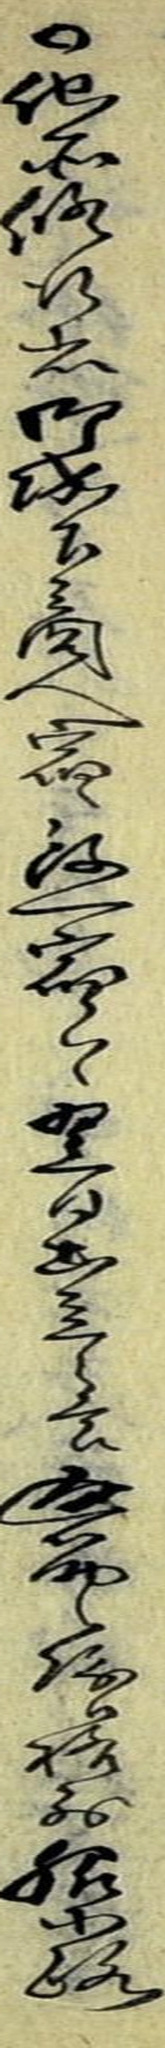〇他所修行者御城下商人宿へ致一宿候ハヽ翌日出立之節通筋之儀ハ格別脇小路
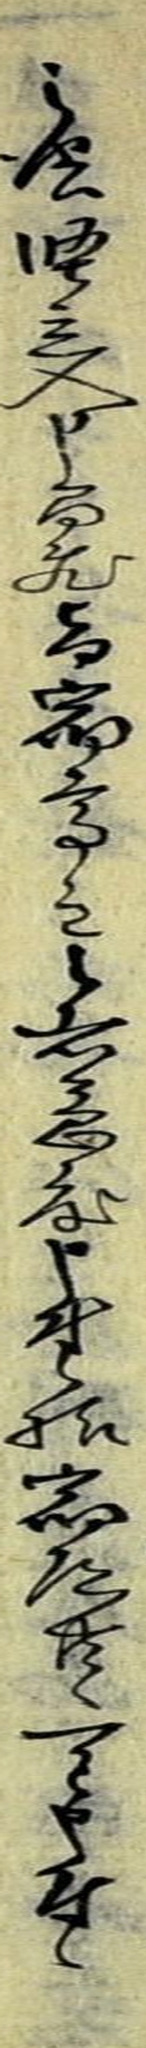之儀ハ堅立入申間敷旨宿亭主之者急度申付候様宿屋共へ可被申付候
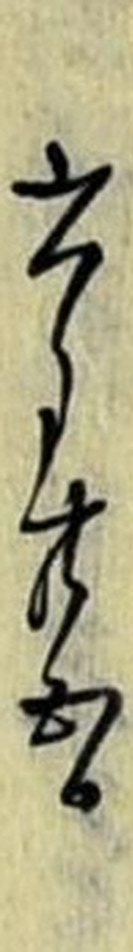六月廿五日
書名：命令之部 三
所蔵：福井県文書館 Fukui Prefectural Archives
